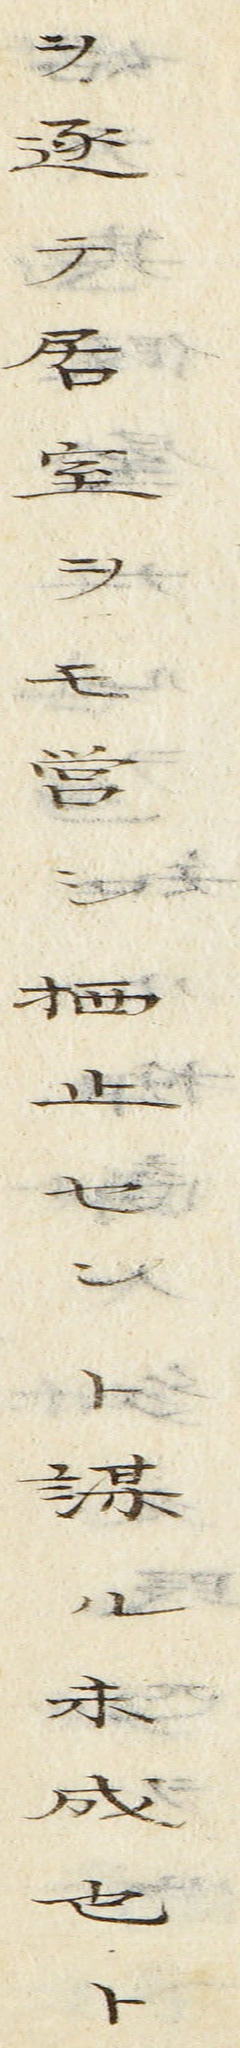ヲ逐テ居室ヲモ営シ栖止セント謀ル未成也ト

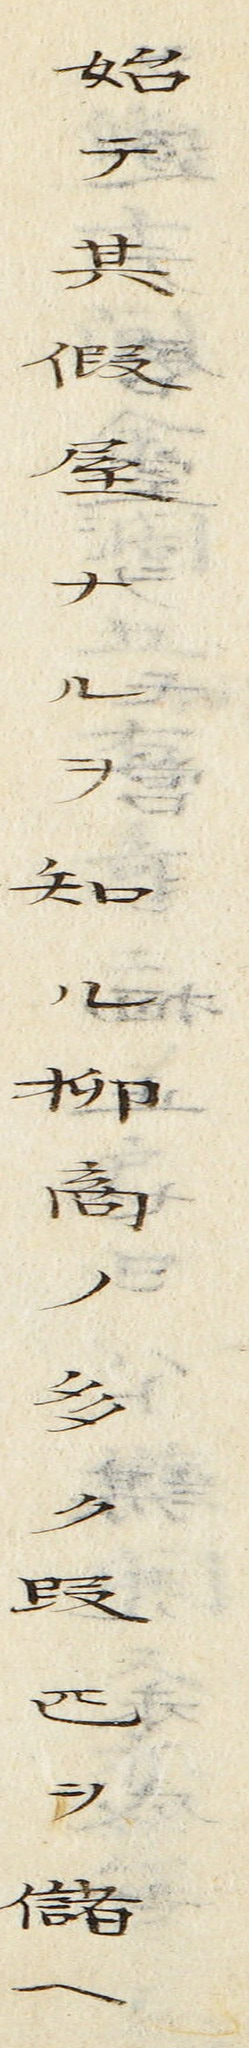始テ其仮屋ナルヲ知ル抑商ノ多ク叚匹ヲ儲ヘ
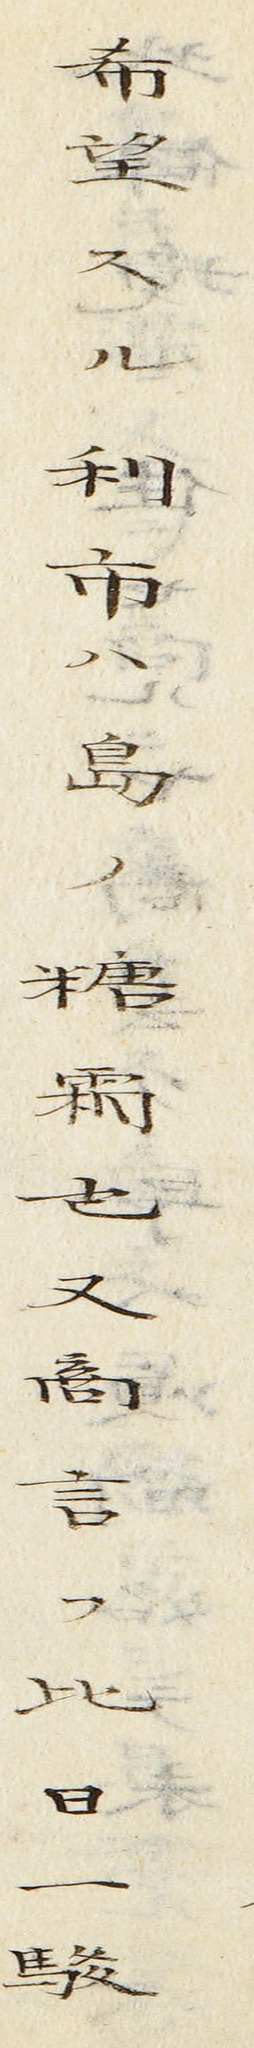希望スル利市ハ島ノ糖霜也又商言フ比日一駱
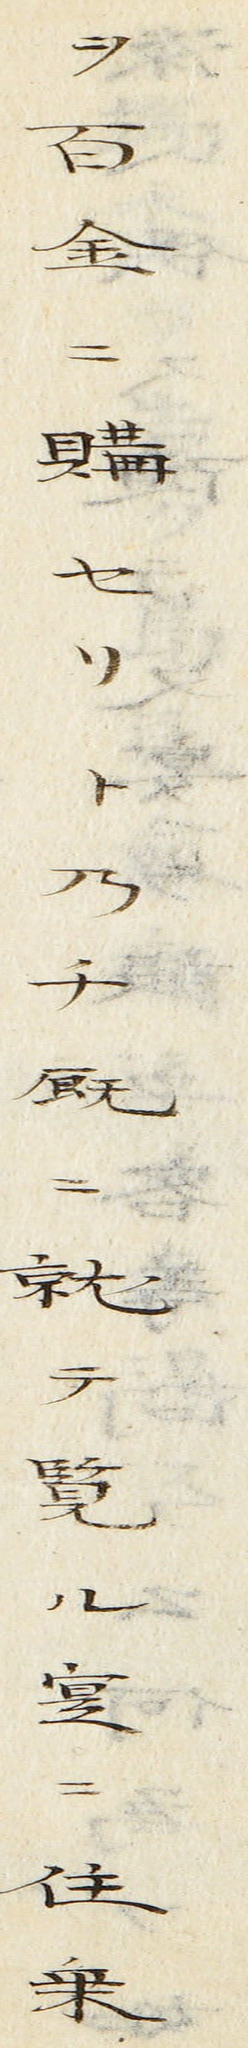ヲ百金ニ購セリト乃チ厩ニ就テ覧ル寔ニ住衆
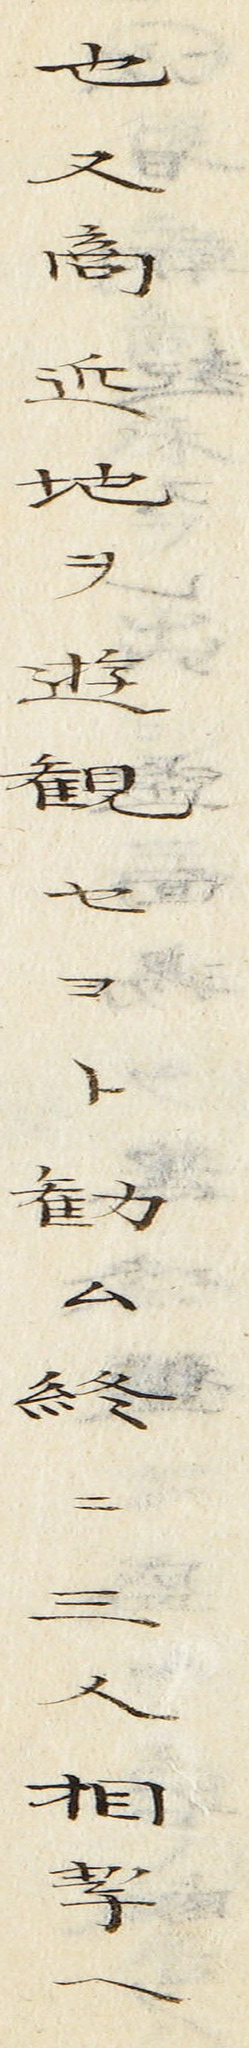也又商近地ヲ遊覧セヨト勧ム終ニ三人相挈ヘ
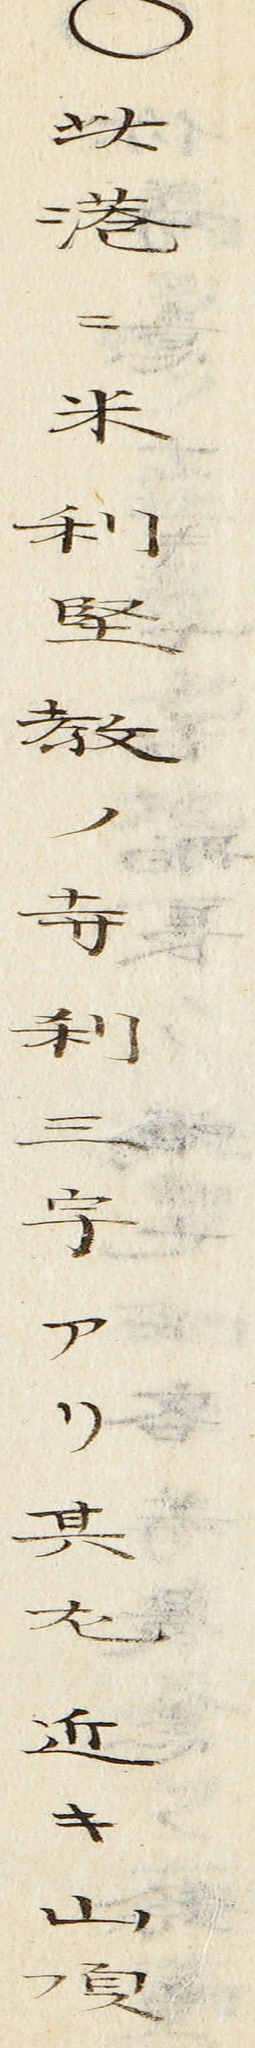○此港ニ米利堅教ノ寺刹三宇アリ其尤近キ山頂
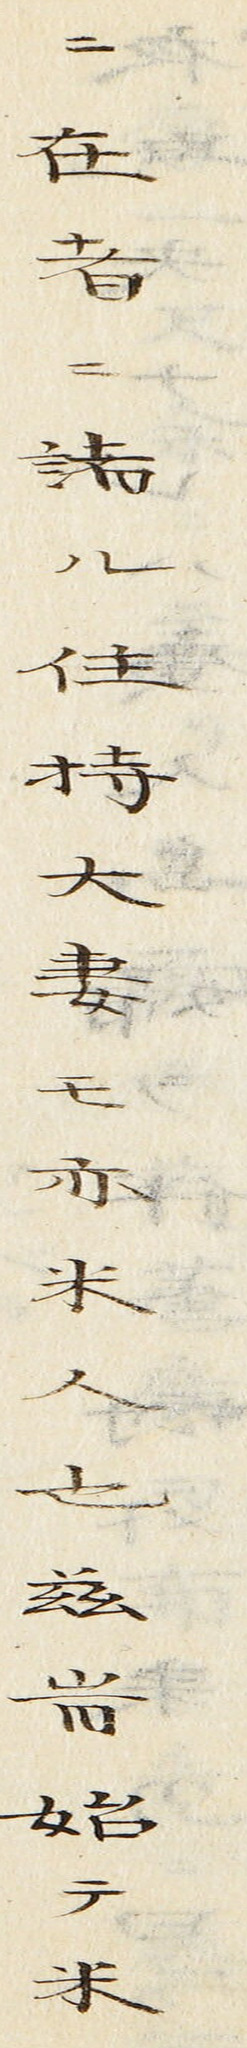ニ在者ニ詣ル住持大妻モ亦米人也茲旹始テ米
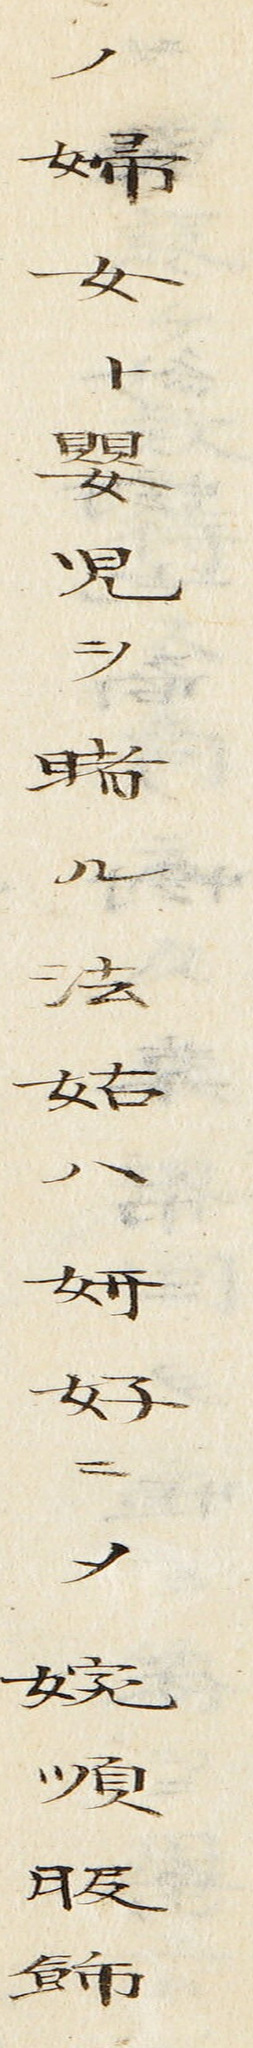ノ婦女ト嬰児ヲ睹ル法姑ハ姸好ニシテ婉順服飾
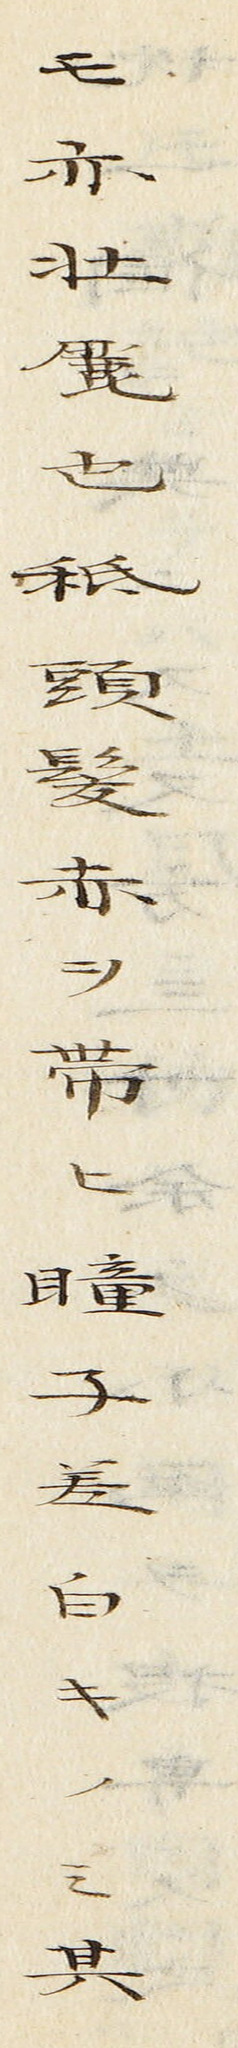モ亦壮麗也秪頭髪赤ヲ帯ヒ瞳子差白キノミ其
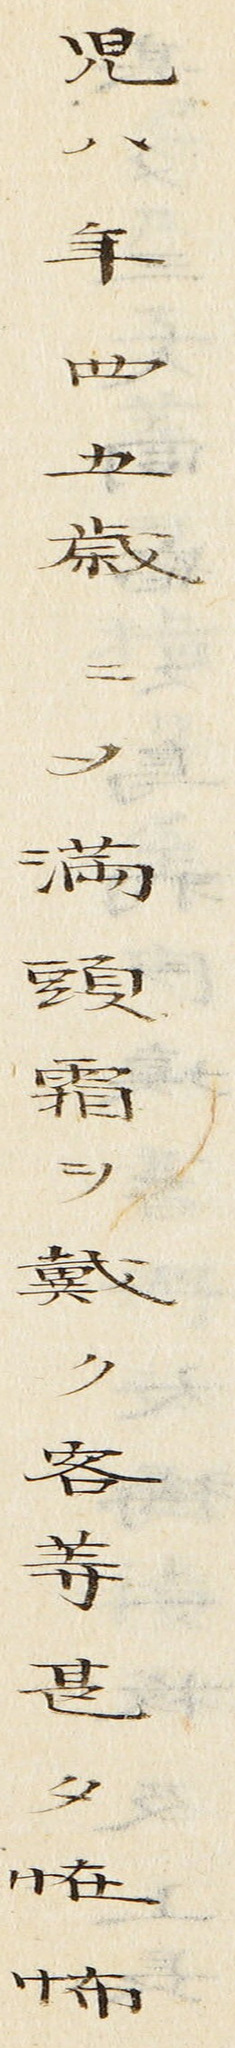児ハ年四五歳ニシテ満頭霜ヲ戴ク客等甚タ恠怖
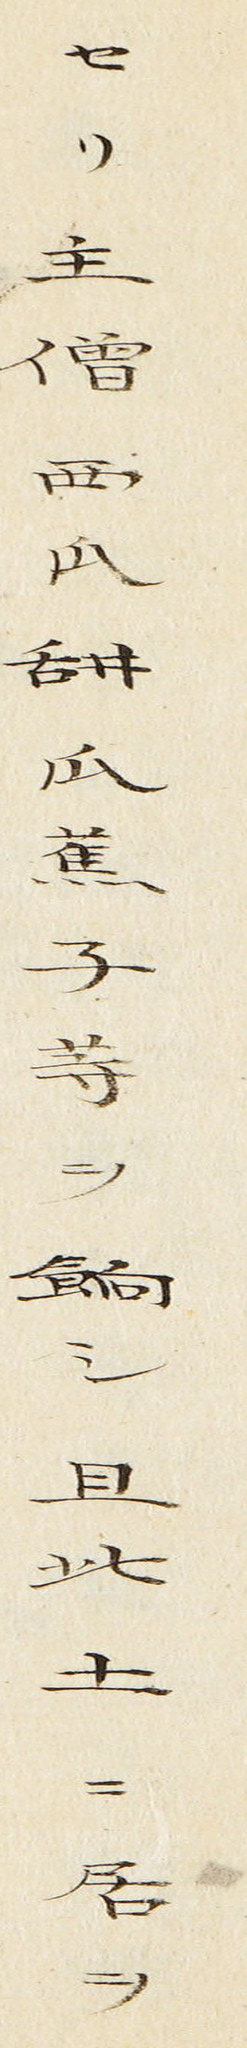セリ主僧西瓜甜瓜蕉子等ヲ餉シ且此土ニ居ヲ
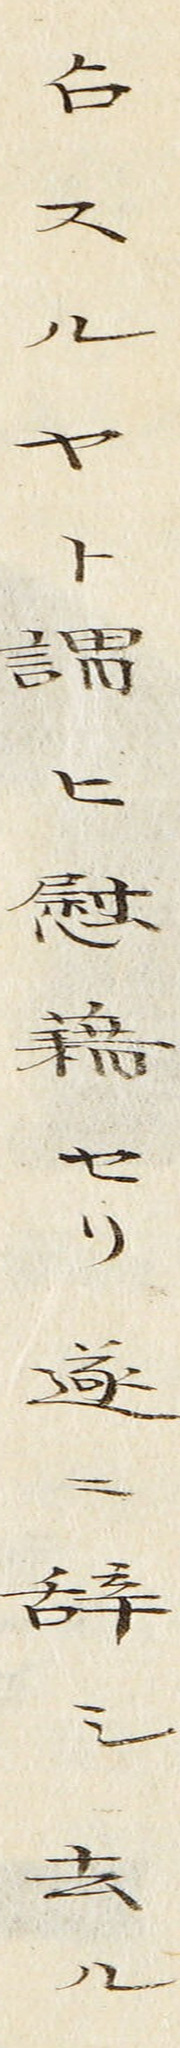占スルヤト謂ヒ慰籍セリ遂ニ辞シ去ル
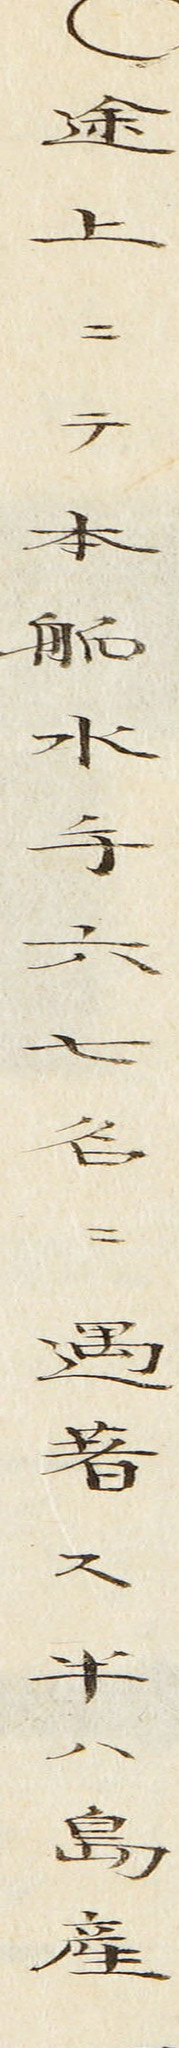○途上ニテ本舶水手六七名ニ遇著ス半ハ島産即チ
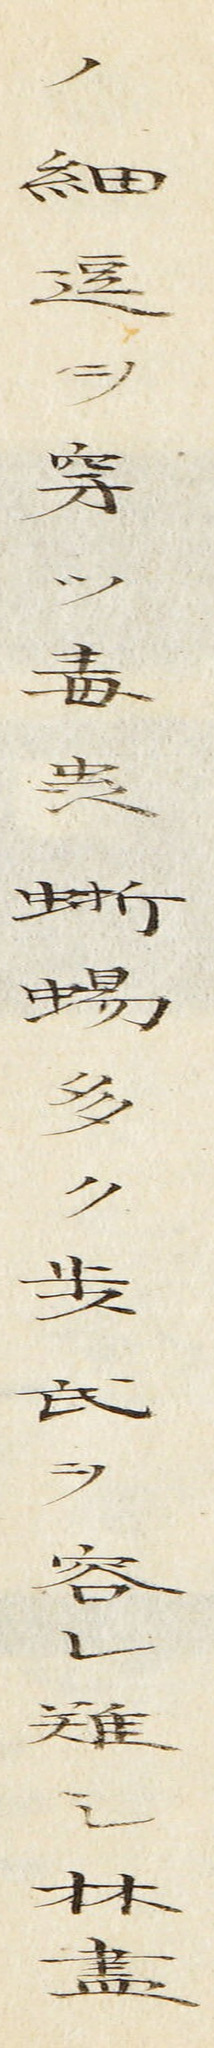ノ細逗ヲ穿ツ毒蟲蜥蜴多ク歩民ヲ容レ難シ林尽
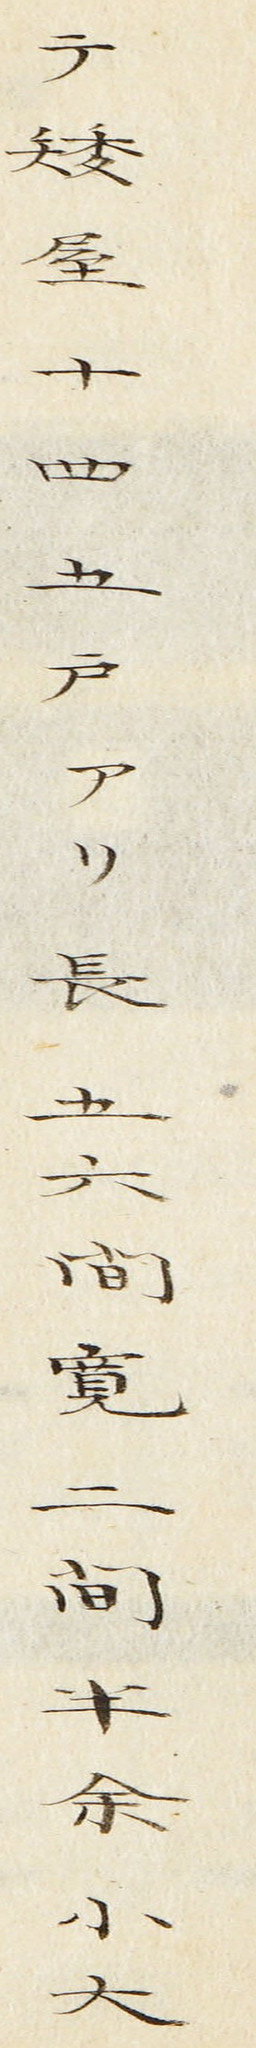テ矮屋十四五戸アリ長五六間寛ニ間半余小大
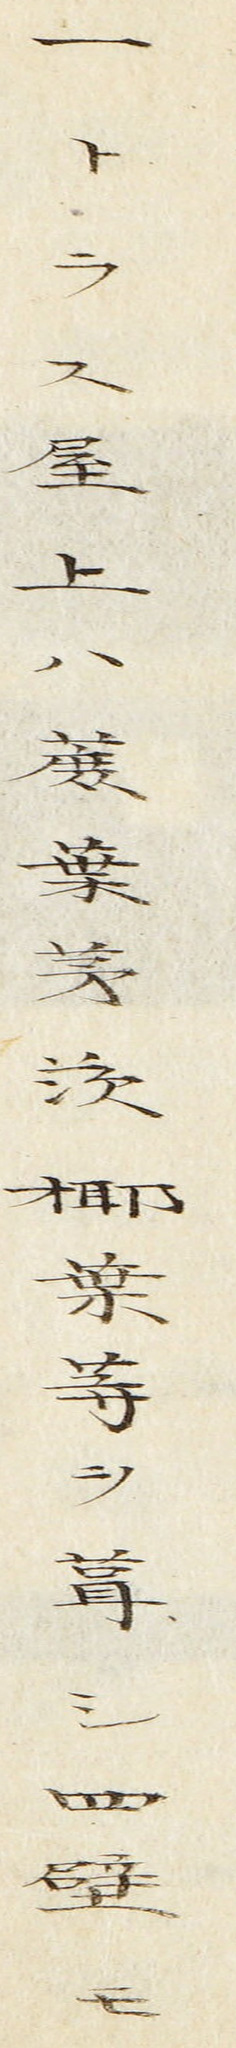一トラス屋上ハ蔗葉茅茨椰葉等ヲ葺シ四壁モ
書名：蕃談
